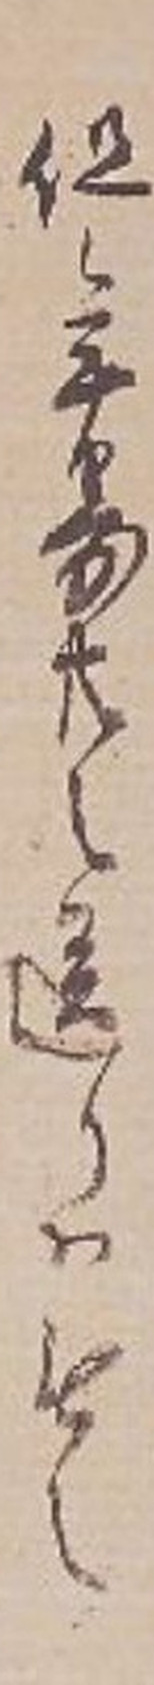但し年寄共之送りは無之
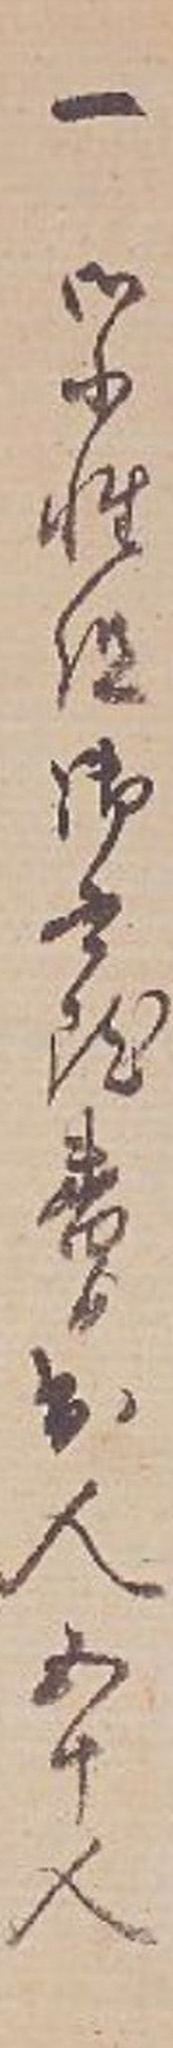一御小姓組御書院ゟ出人五十人
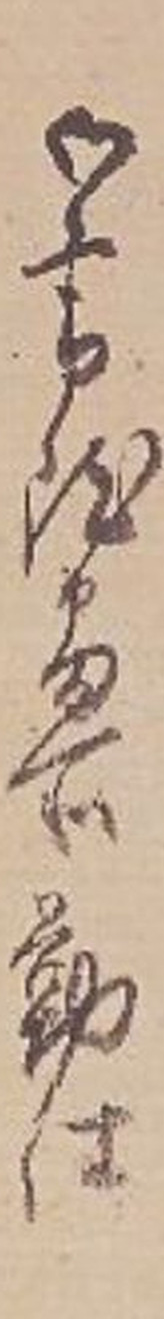御書院番所勤仕
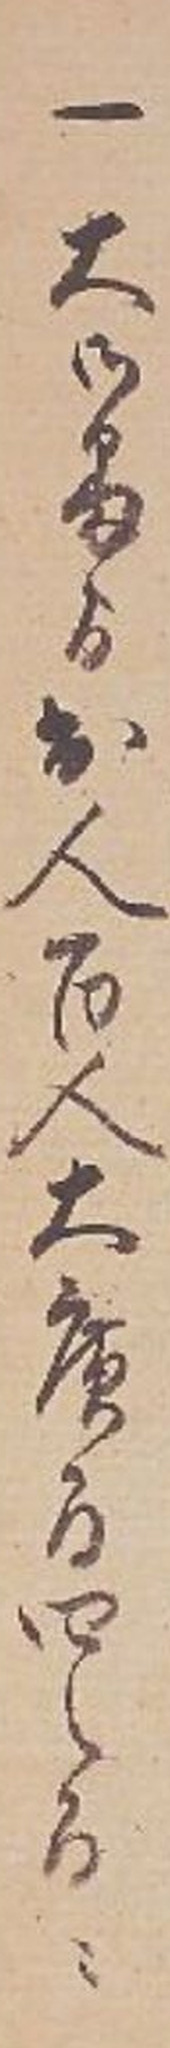一大御番ゟ出人百人大広間四之間に
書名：琉球人来朝記 三、四
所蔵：University of the Ryukyus Library
